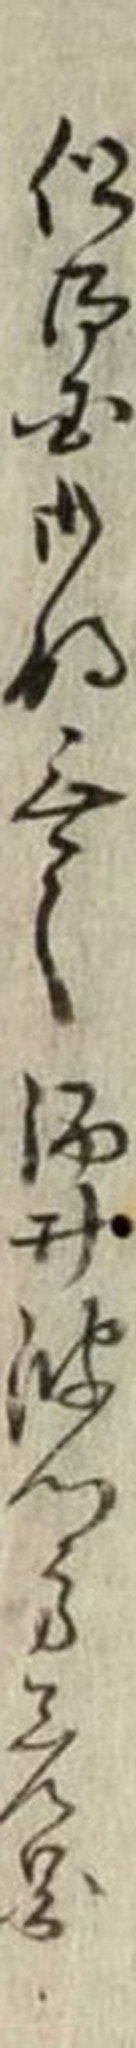但御国御触無之酒井波門方差図
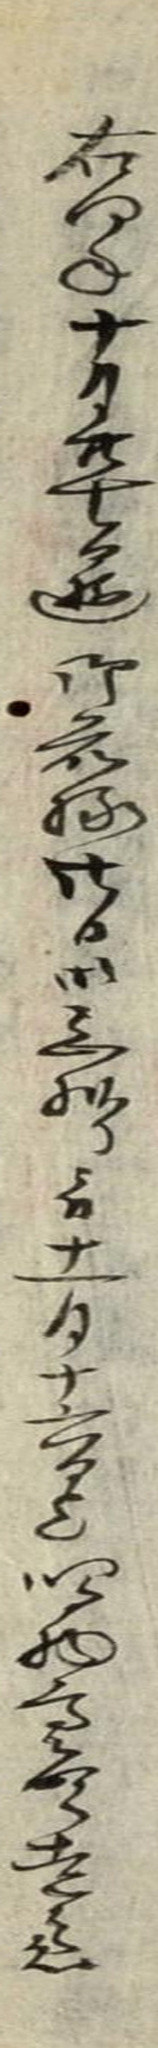右同年十月廿七日逝御前様廿日御忌掛りに付十一月十六日迄鳴物高声遠慮
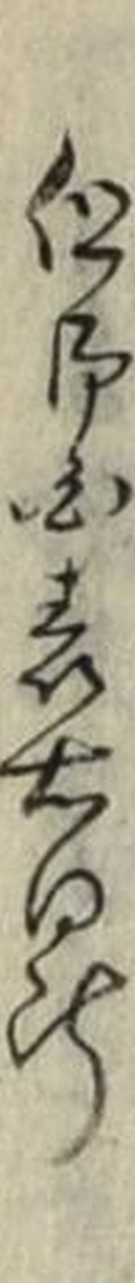但御国表右同断
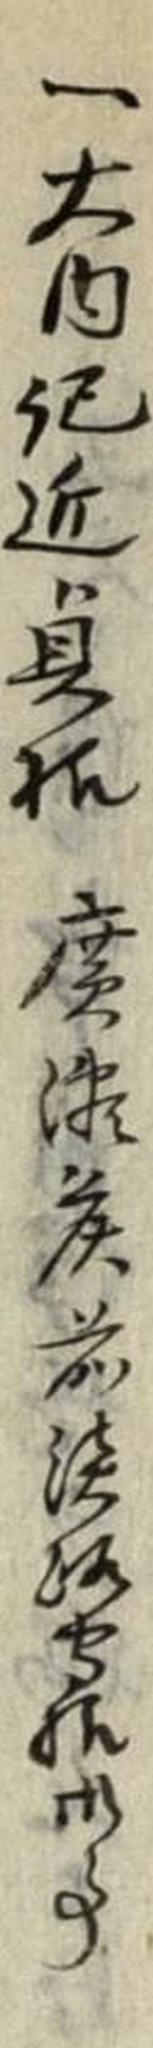一大内記近貞様広瀬侯前淡路守様御事
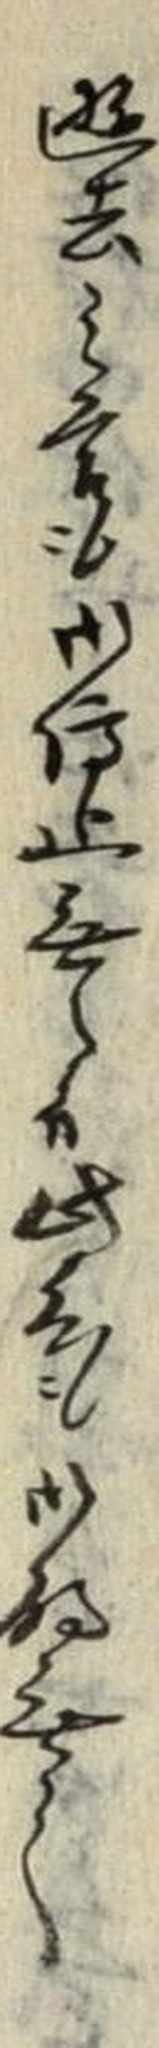逝去之節も御停止無之に付此度も御触無之
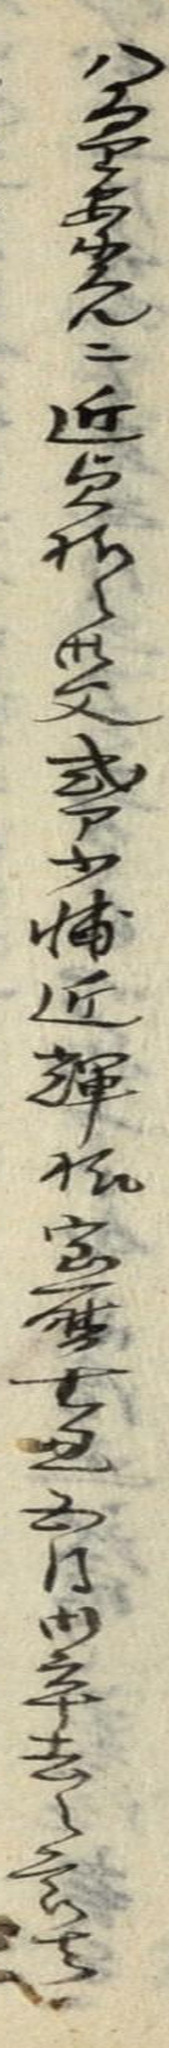八百里案ルに近貞様之御父式部少輔近輝様宝暦七丑五月御卒去之節は
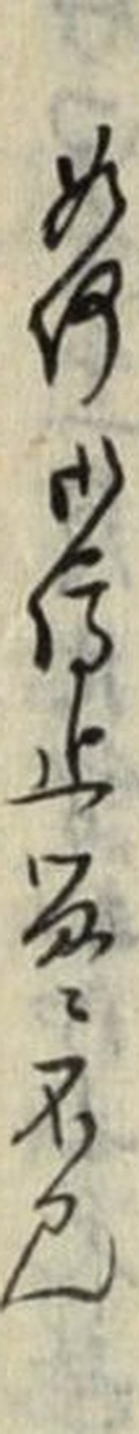如何御停止留に不見
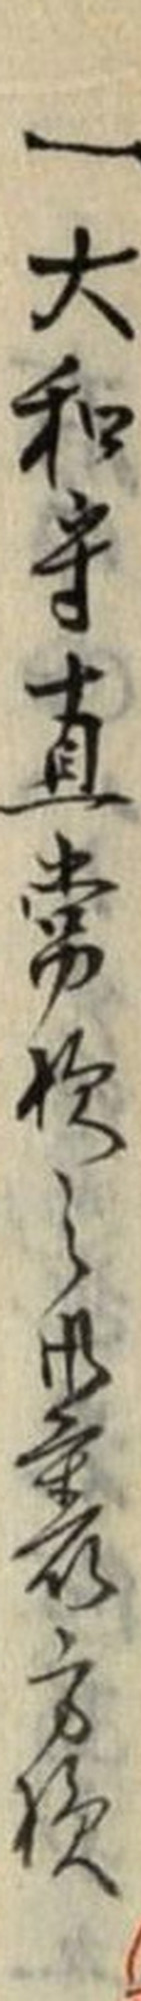一大和守直常様之御裏方様
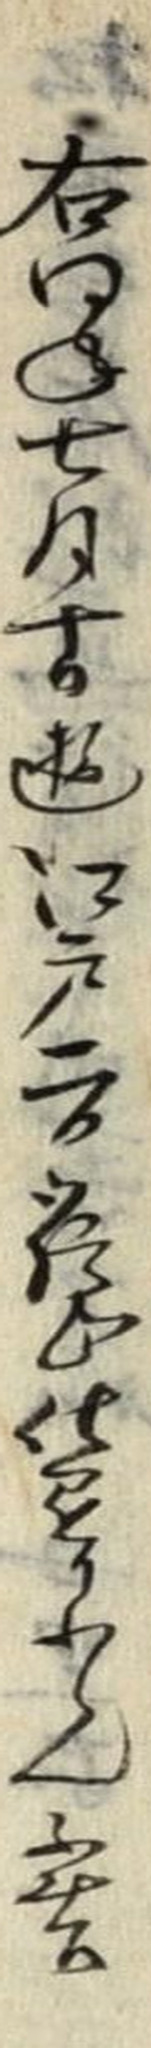右同年七月十日逝江戸二日御停止仕懸りふしん不苦
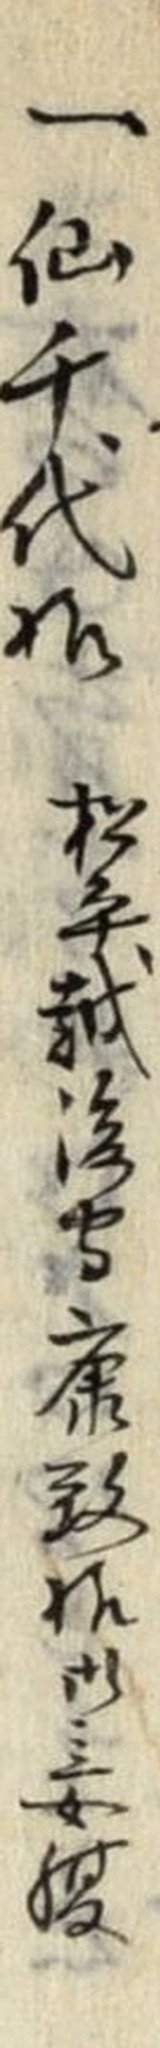一仙千代様松平越後守康致様御妾腹
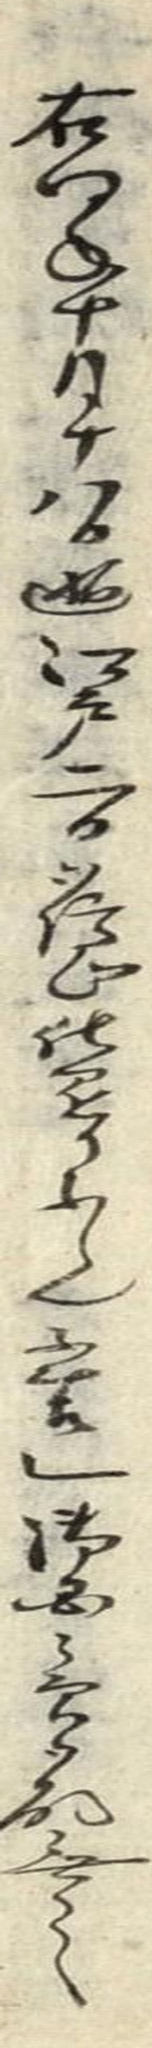右同年十月十八日逝江戸二日御停止仕懸りふしん不苦」御国にては御触無之
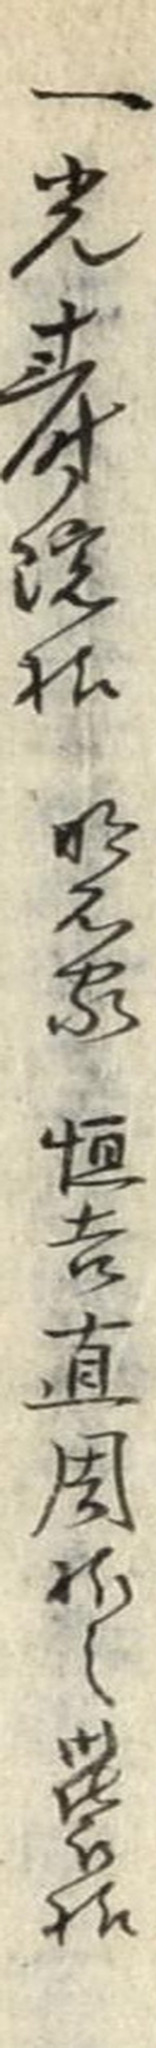一光寿院様明石家恒吉直周様之御袋様
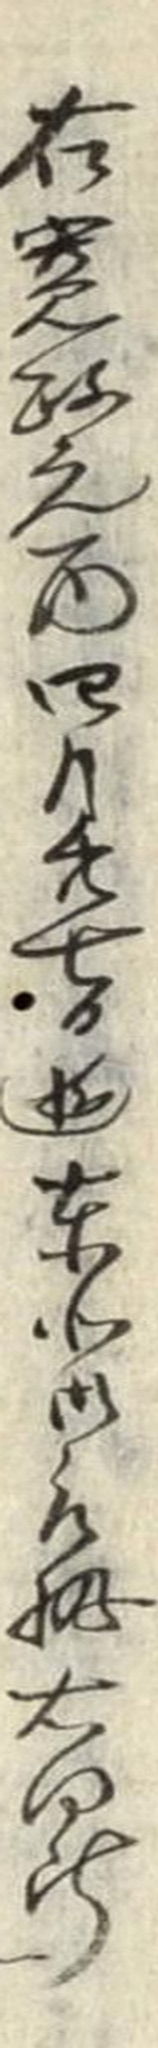右寛政元酉四月廿七日逝東北御取扱右同断
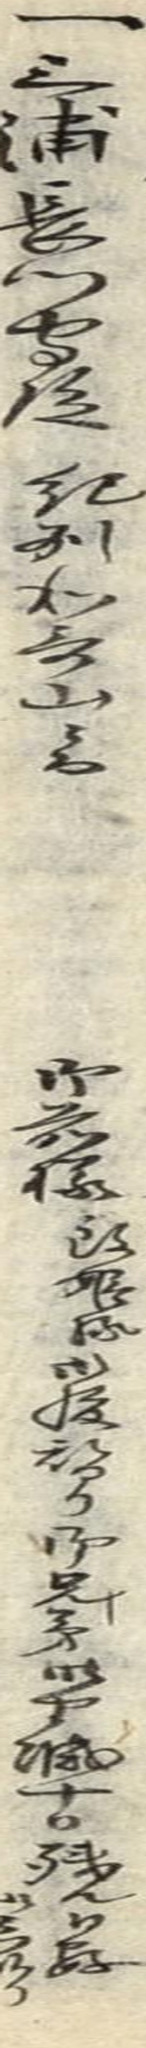一三浦長門守殿紀州和歌山にて御前様致姫様御腹替り御兄弟御半減十日残ル日数御忌掛り
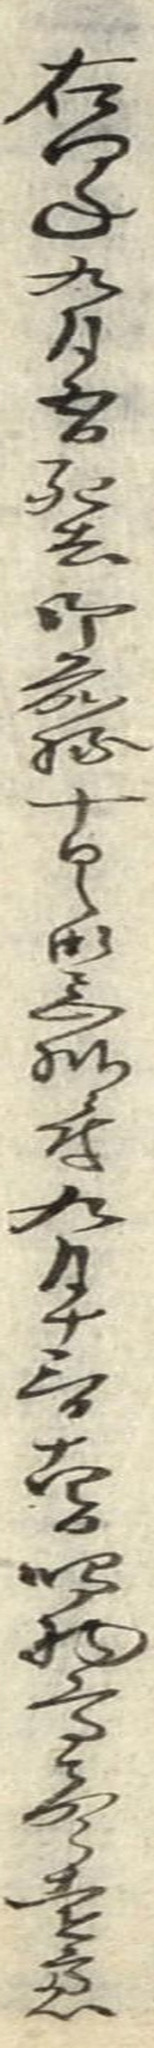右同年九月五日死去御前様十日之御忌掛に付九月十三日十四日鳴物高声遠慮
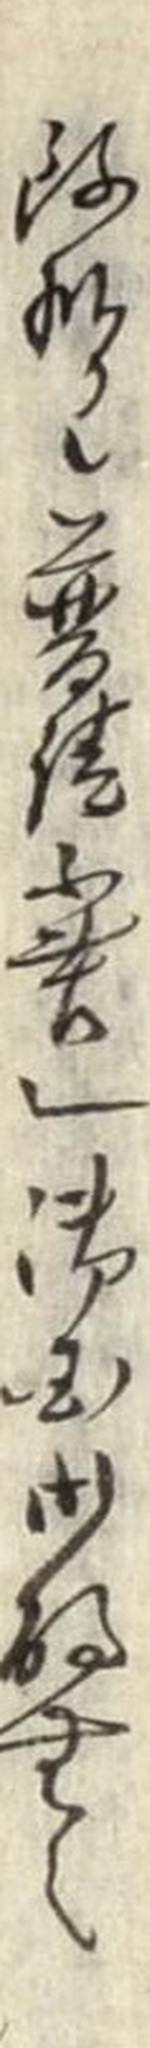致掛り候普請不苦」御国御触無之
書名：御停止異変死失
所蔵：福井県文書館 Fukui Prefectural Archives
